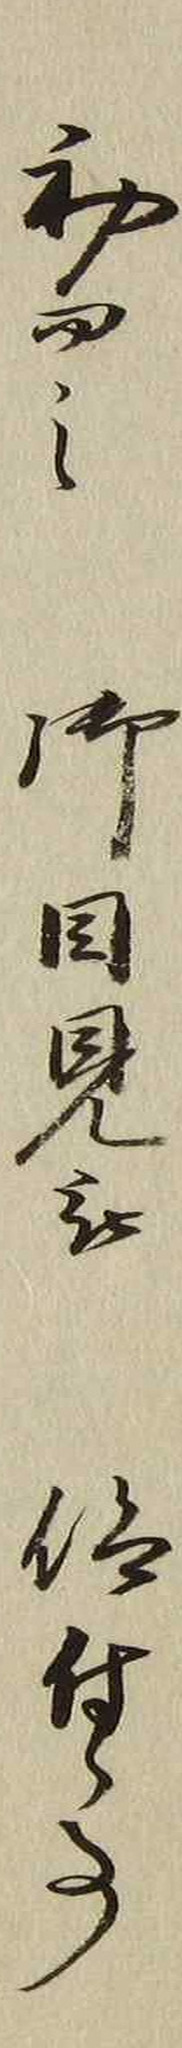初而之御目見被仰付候事
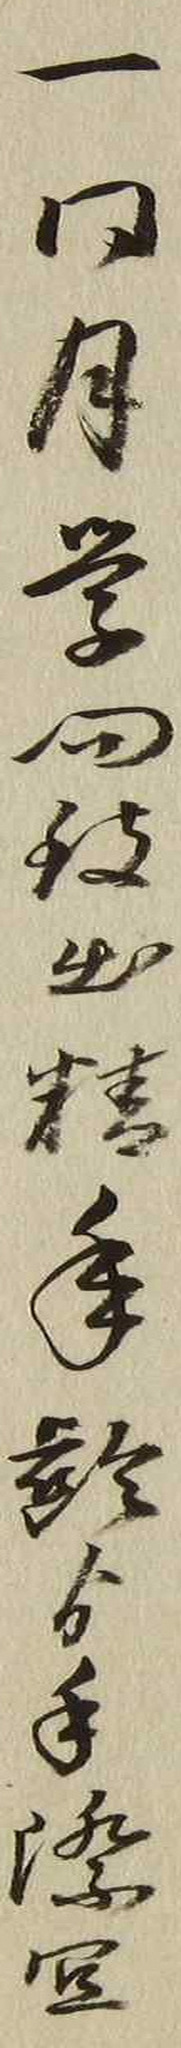一同月学問致出精年齢ゟ手際宜
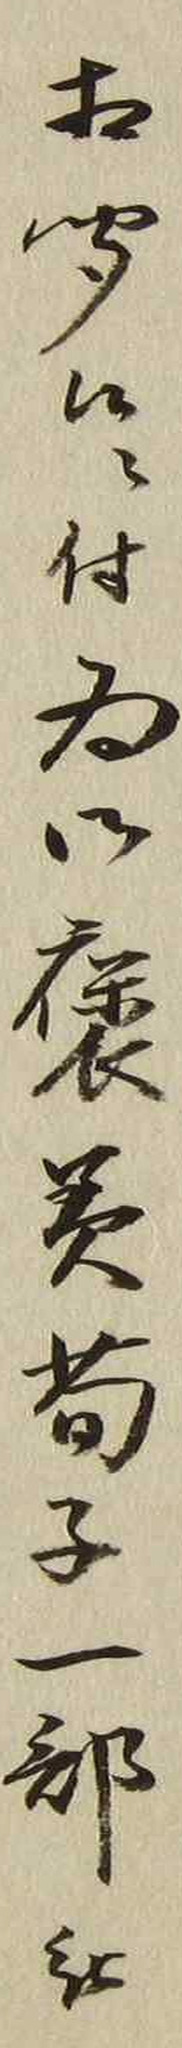相聞候ニ付為御褒美荀子一部被
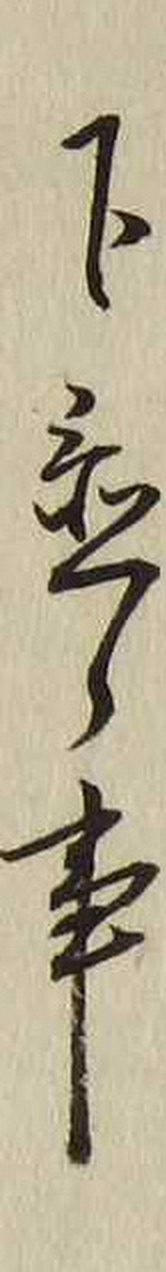下置候事
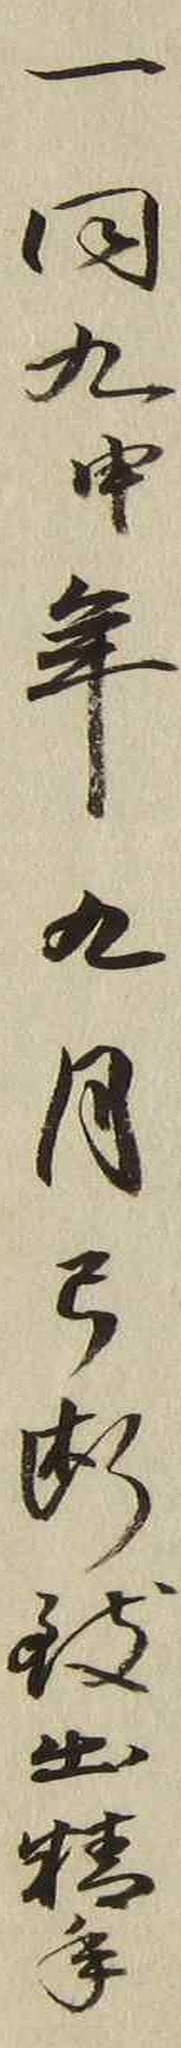一同九申年九月弓術致出精年
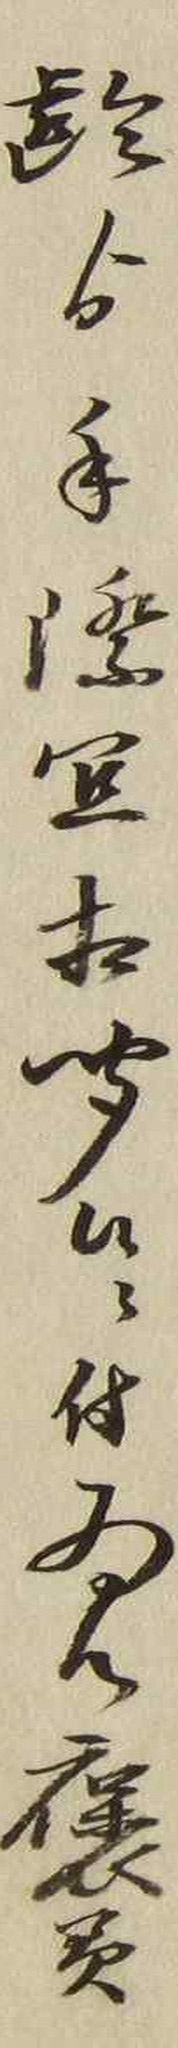齢ゟ手際宜相聞候ニ付為御褒美

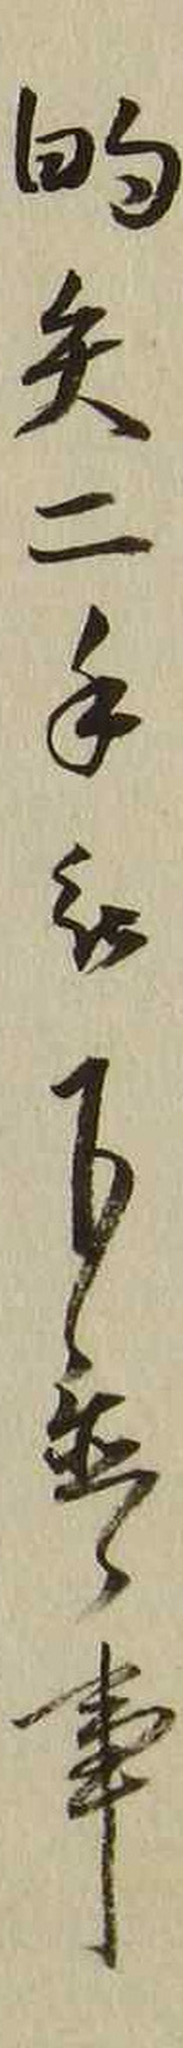的矢二手被下置候事
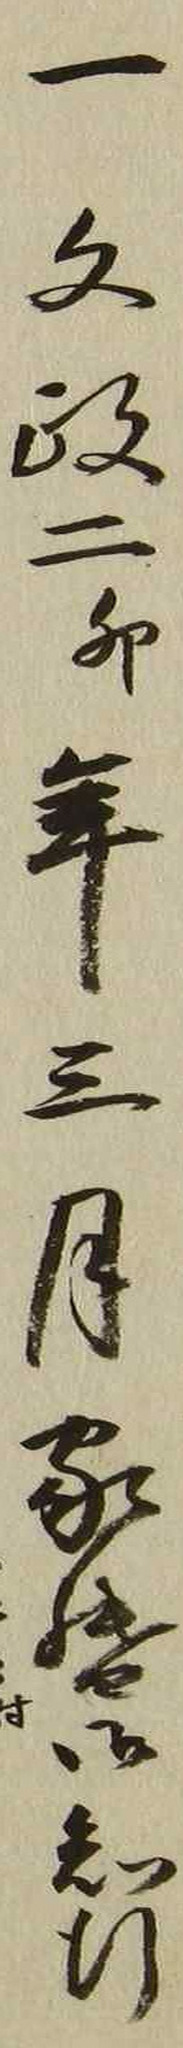一文政二卯年三月家督御知行
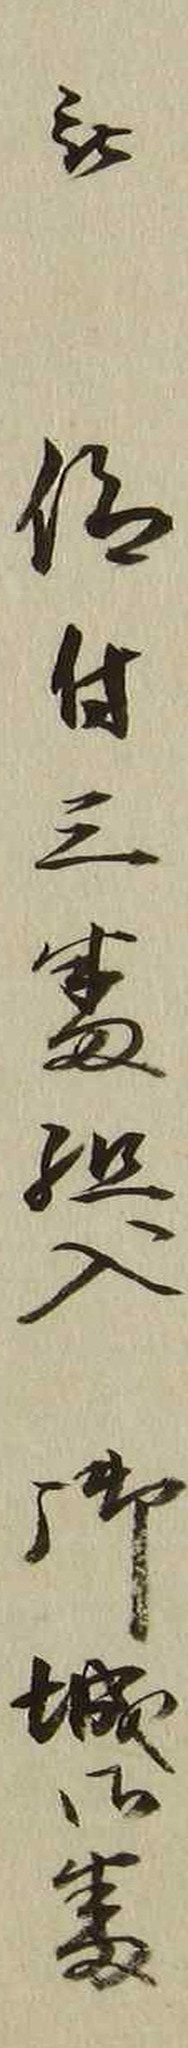被仰付三番組へ入御城御番
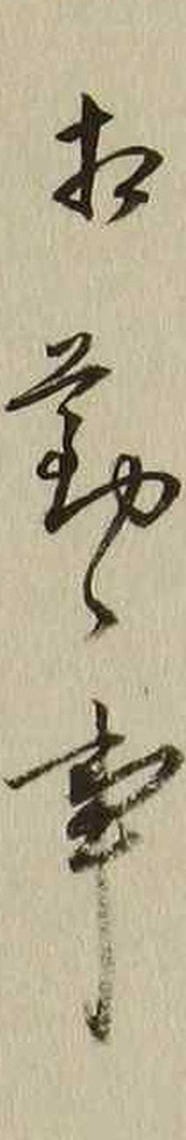相勤候事
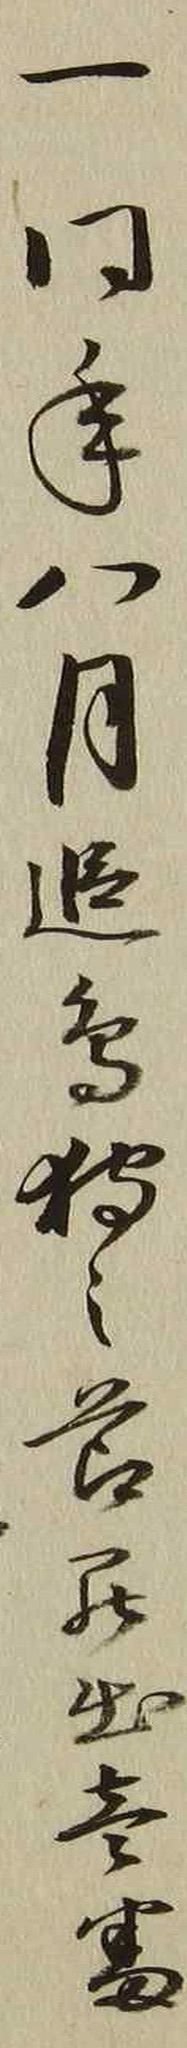一同年八月追鳥狩之節罷出壱番
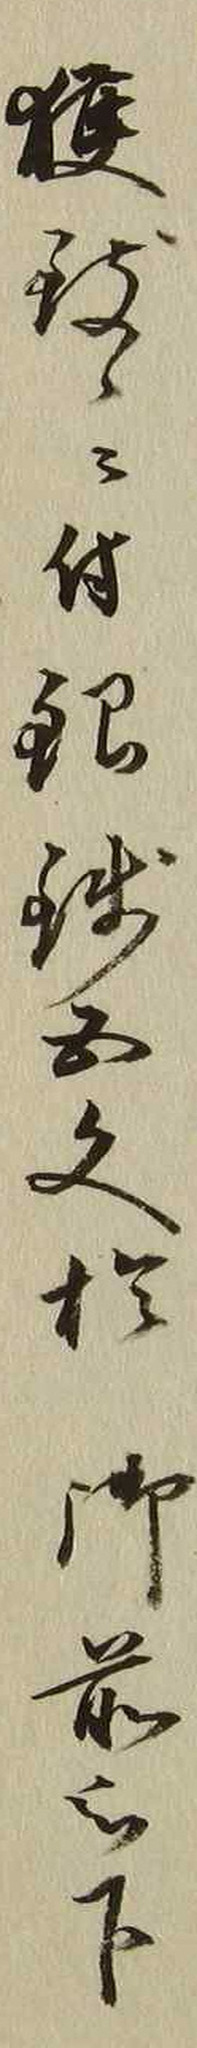獲致候ニ付銀銭五文於御前被下
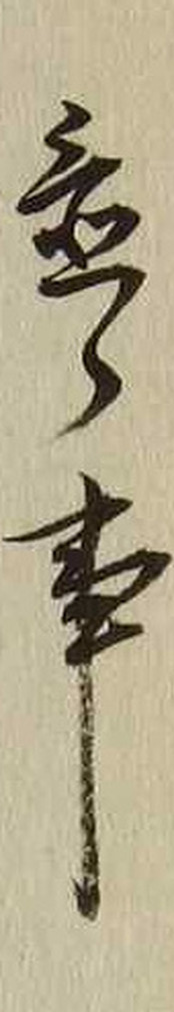置候事
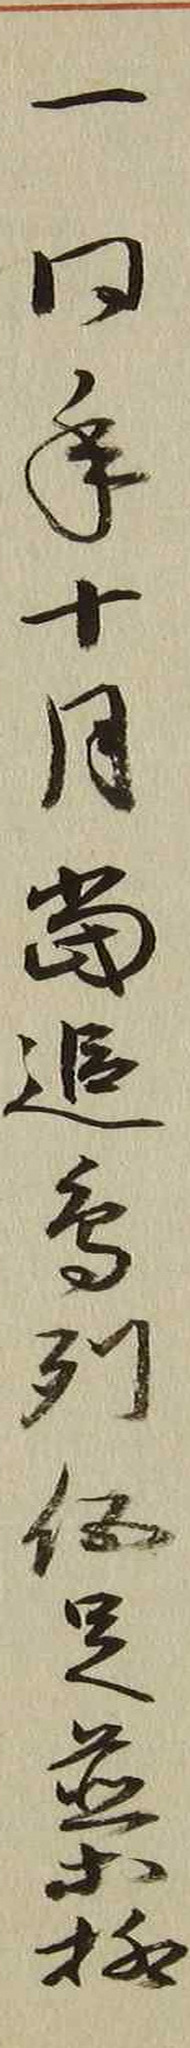一同年十月当追鳥列伍足並等格
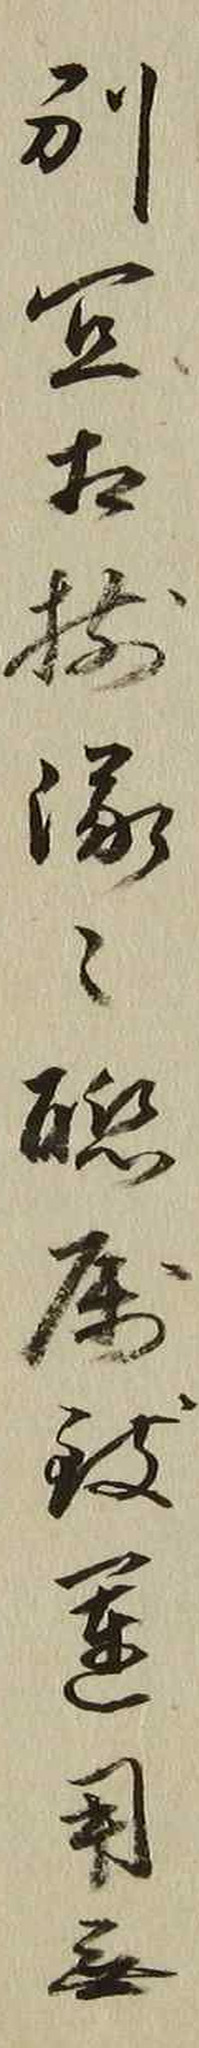別宜相揃隊々聯属致運用無
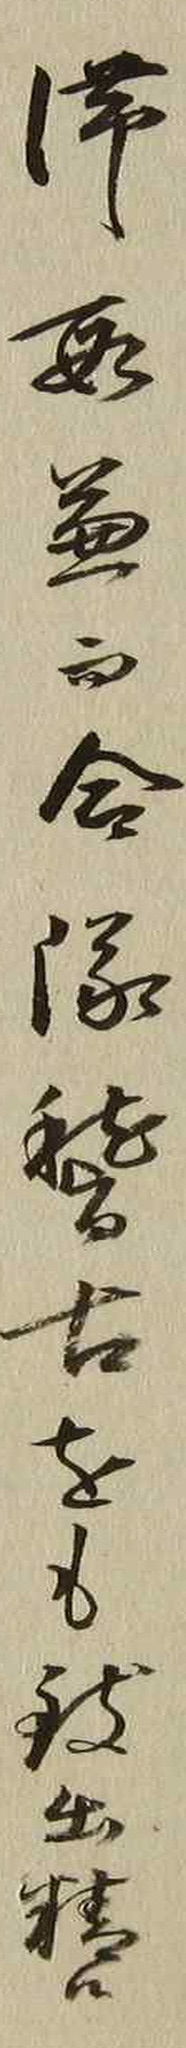滞段兼而合隊稽古をも致出精候
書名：諸士系譜　巻之69　を之部3
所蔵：会津若松市立会津図書館
